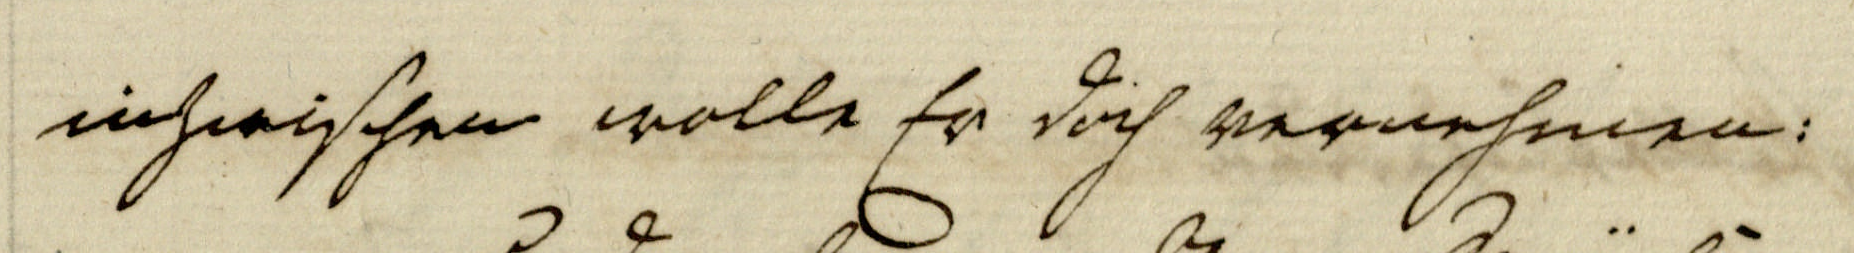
inzwischen wolle Er doch vernehmen:
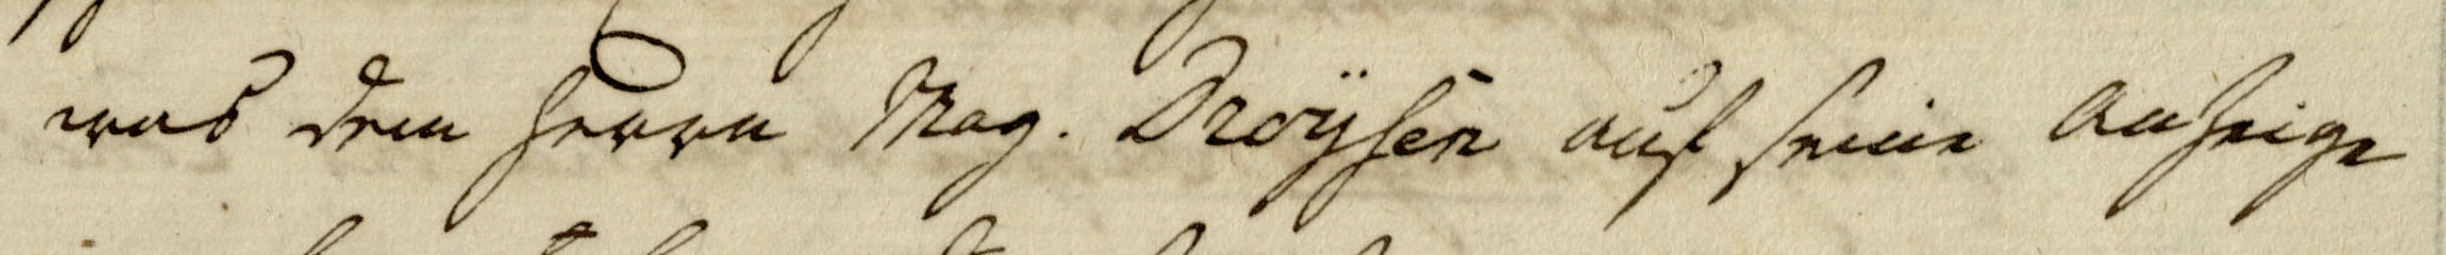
was dem Herrn Mag. Droÿsen auf seine Anzeige
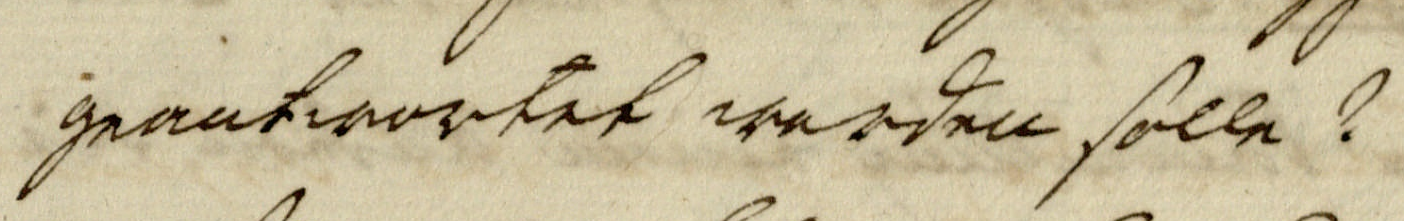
geantwortet werden solle?
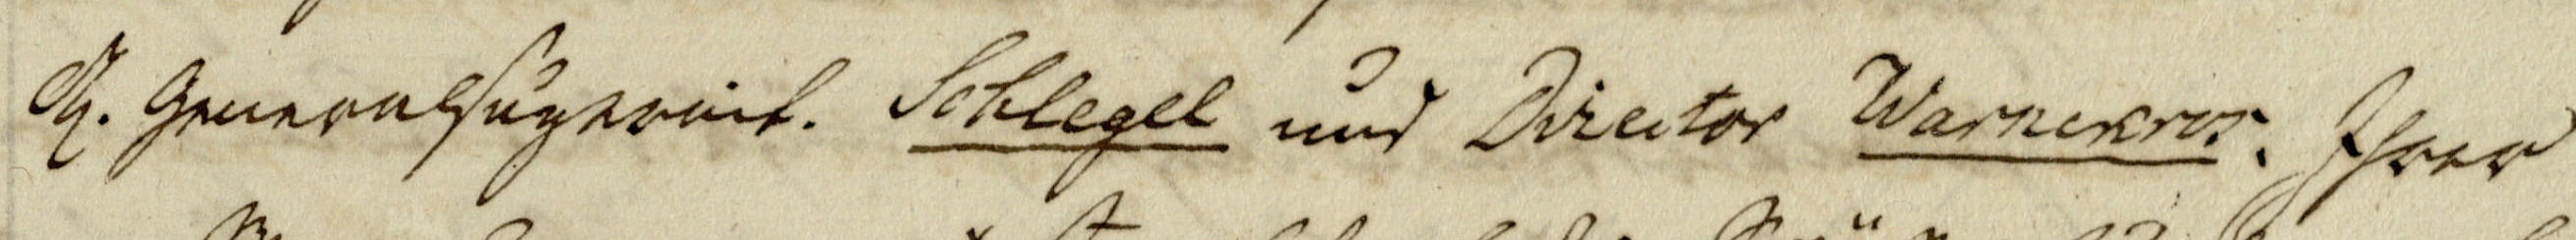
dh. Generalsuperint. Schlegel und Director Warnekros. Ihrer
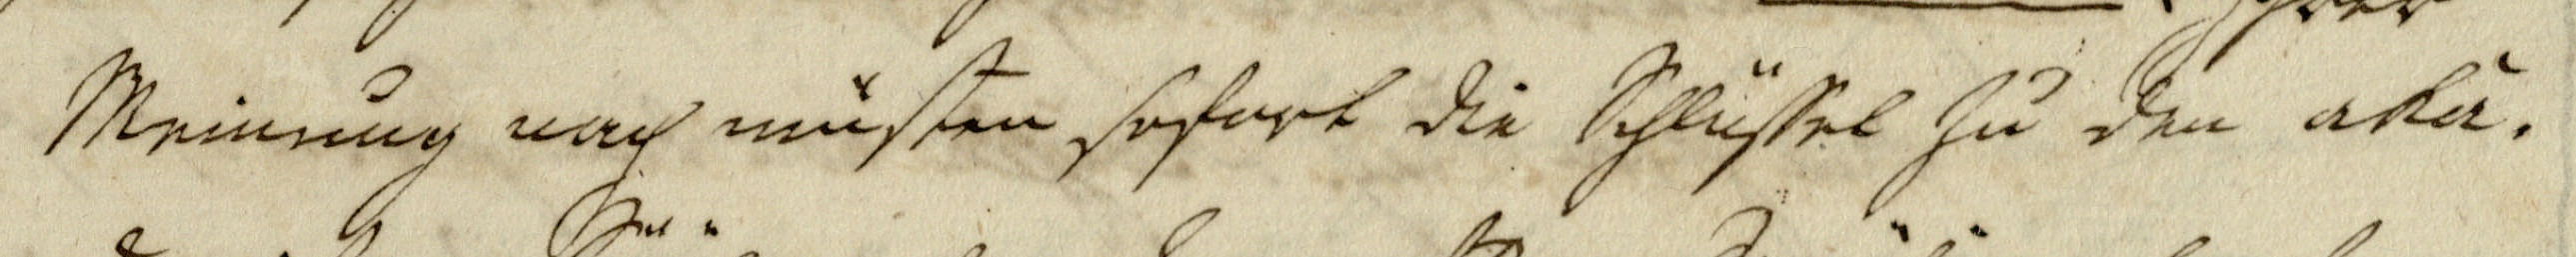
Meinung nach müßten sofort die Schlüssel zu den aka¬
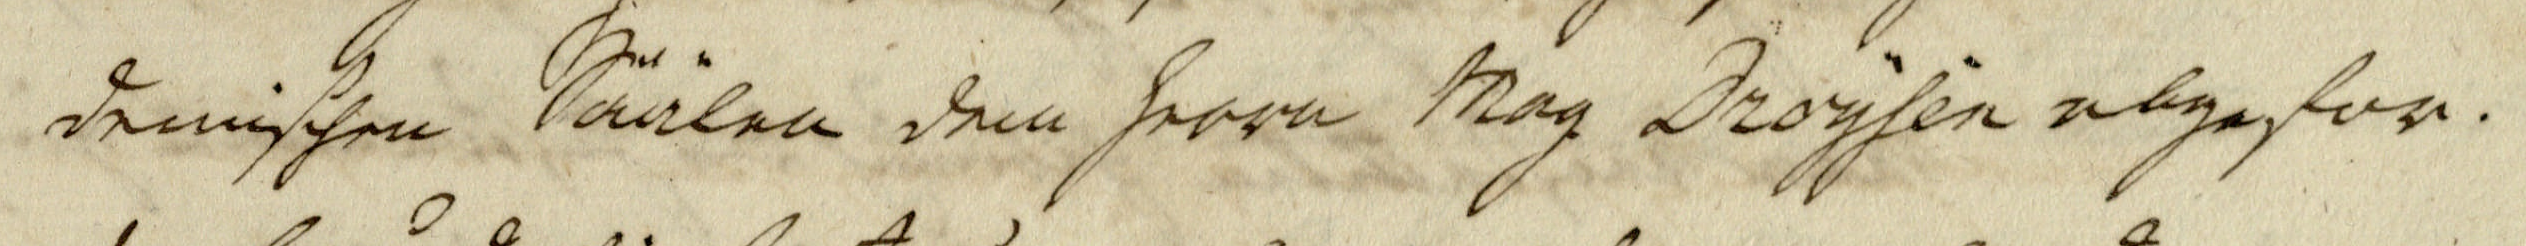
demischen Saälen dem Herrn Mag. Droÿsen abgefor¬
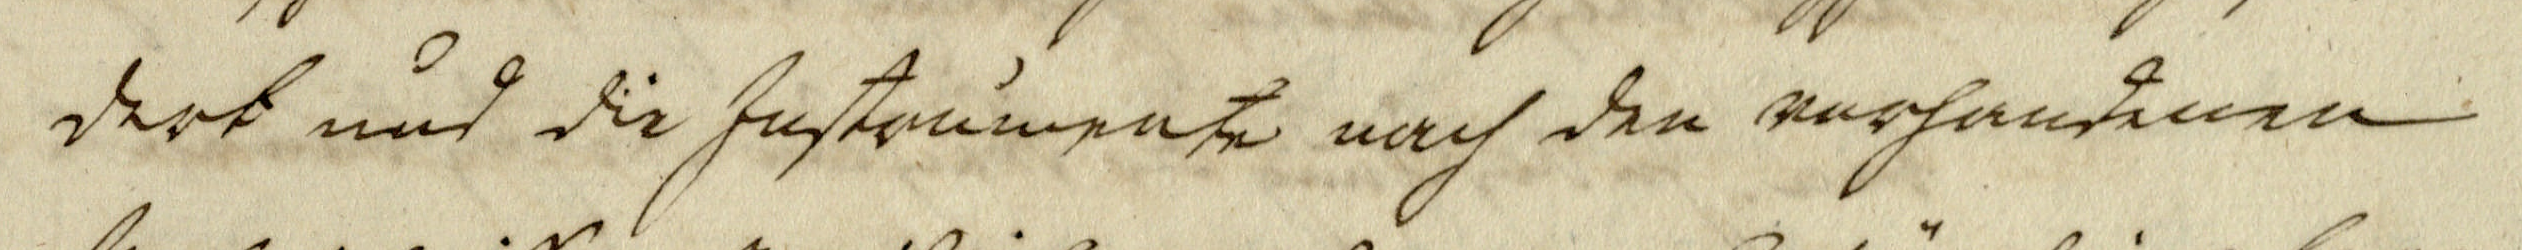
dert und die Instrumente nach den vorhandenen
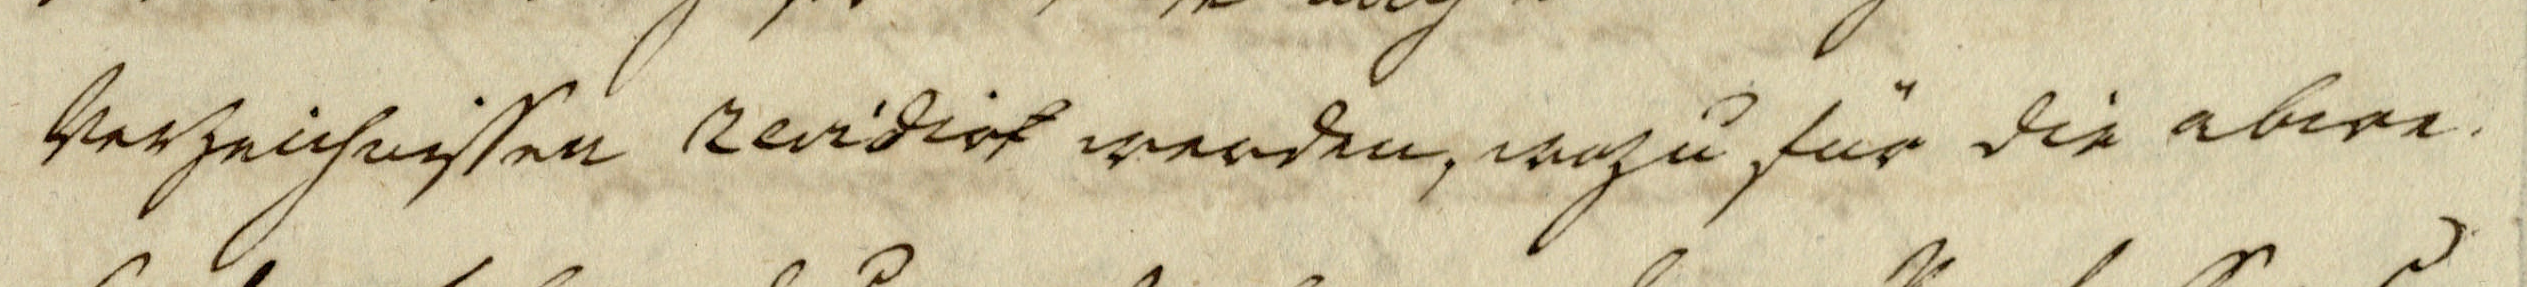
Verzeichnissen revidirt werden, wozu für die abwe¬
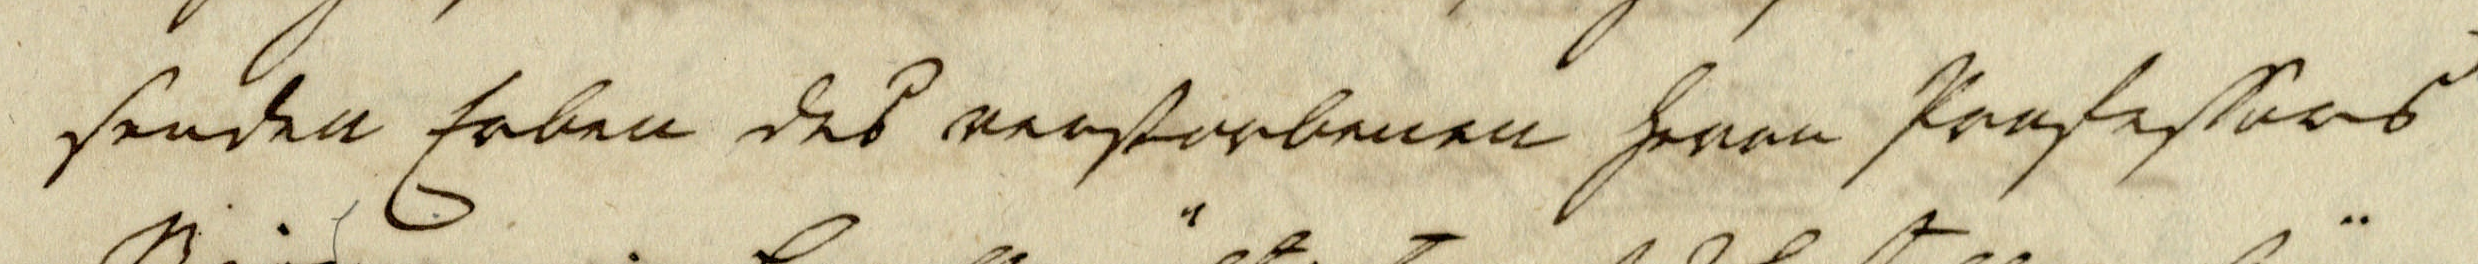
senden Erben des verstorbenen Herrn Professors
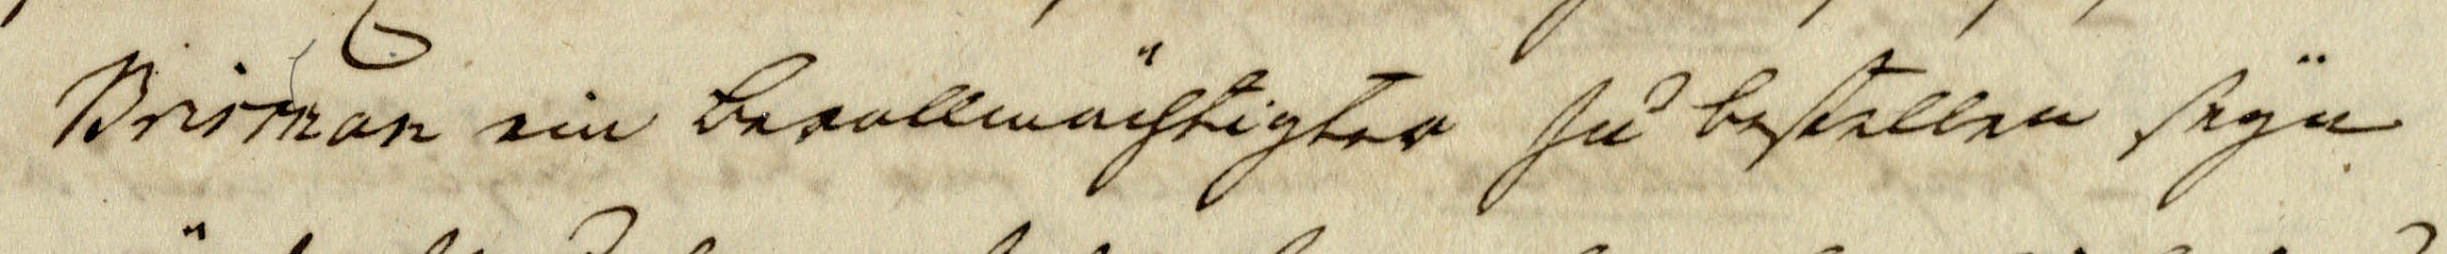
Brisman ein Bevollmächtigter zu bestellen seÿn
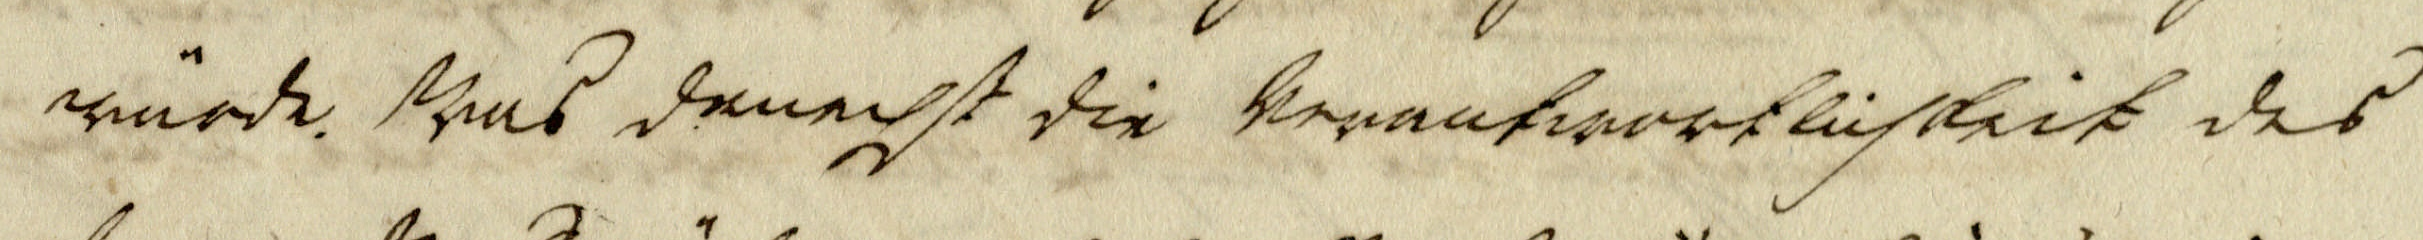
würde. Was danechst die Verantwortlichkeit des
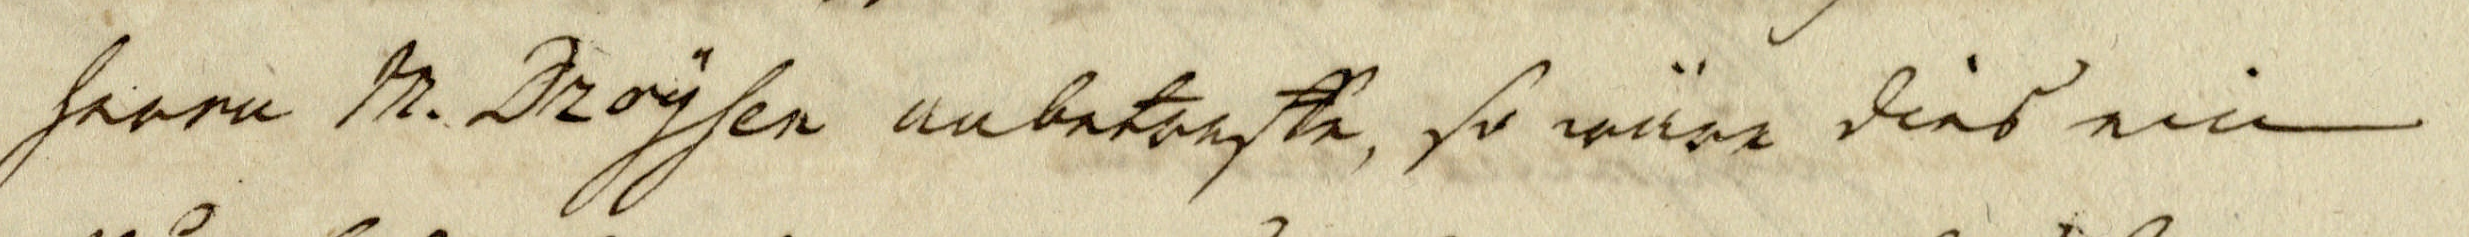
Herrn M. Droÿsen anbetreffe, so wäre dies ein
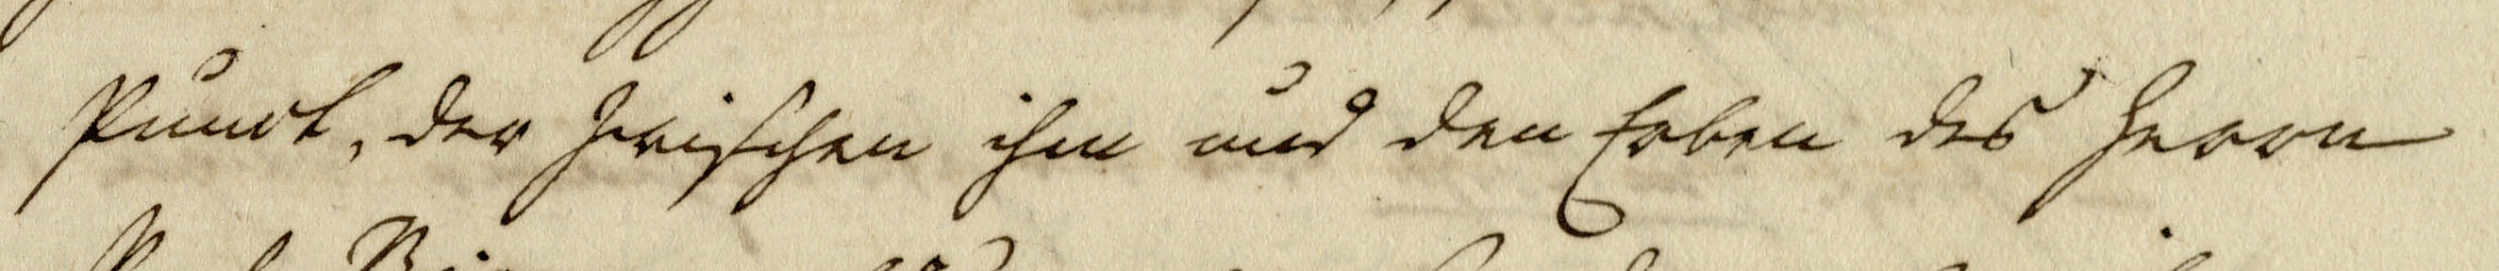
Punct, der zwischen ihm und den Erben des Herrn
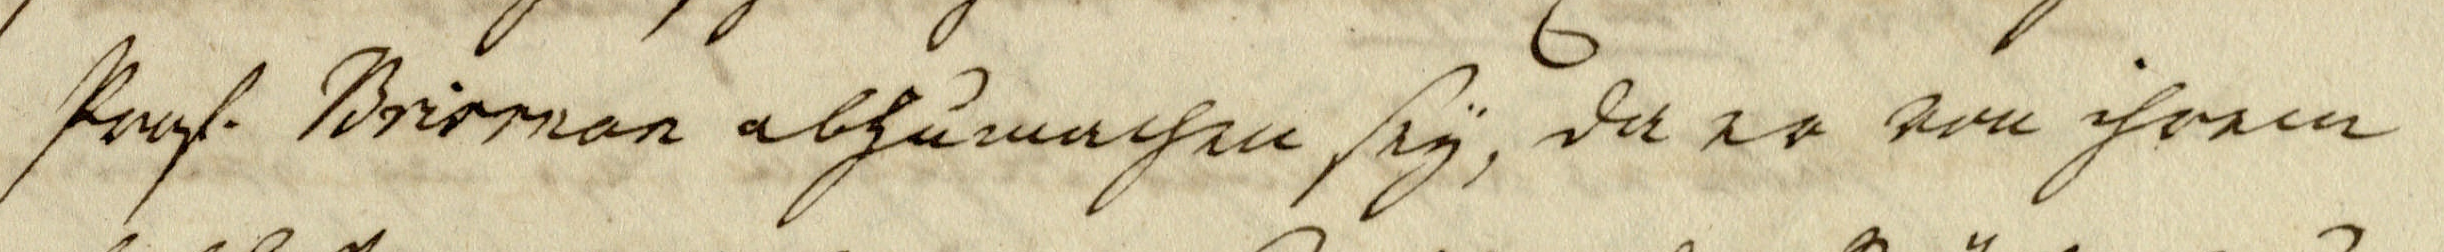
Prof. Brisman abzumachen seÿ, da er von ihrem
